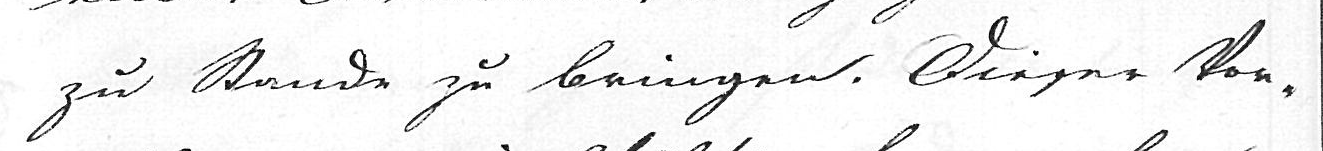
zu Stande zu bringen. Dieser Vor-
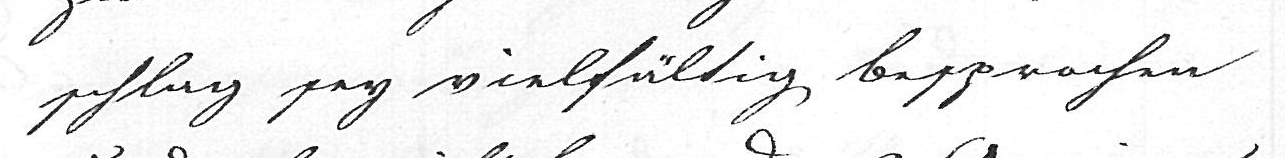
schlag sey vielfältig besprochen
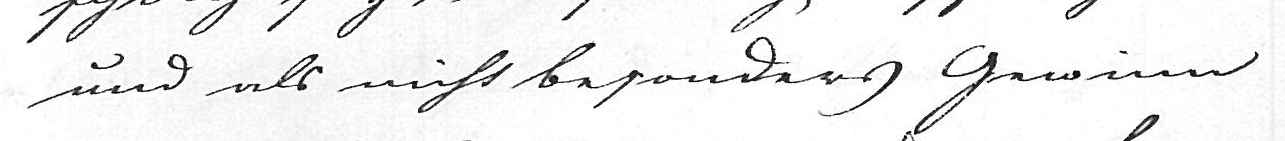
und als nicht besonders Gewinn
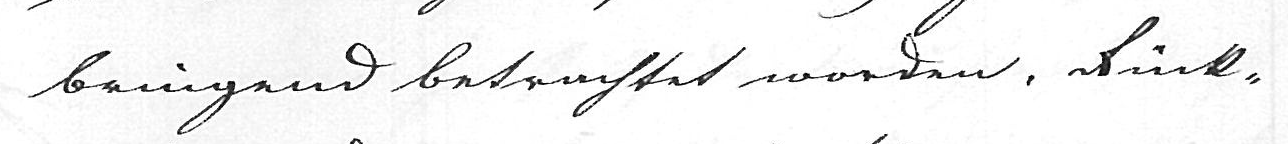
bringend betrachtet worden. Rück-
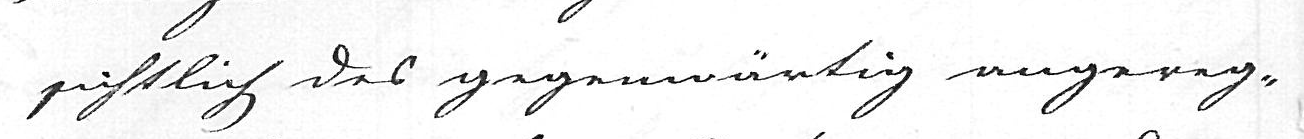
sichtlich des gegenwärtig angereg-
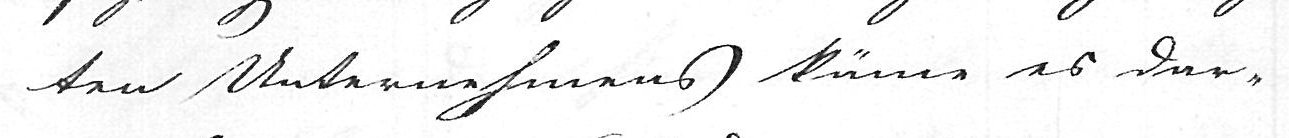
ten Unternehmens käme es dar-
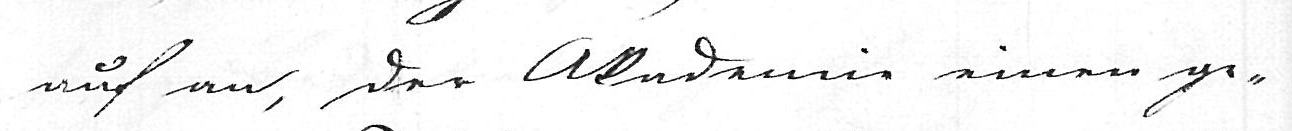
auf an, der Akademie einen ge-
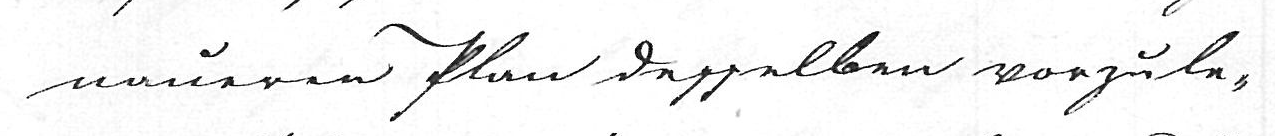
naueren Plan desselben vorzule-
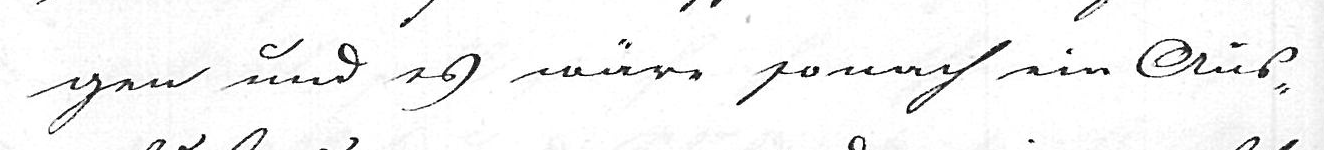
gen und es wäre sonach ein Aus-
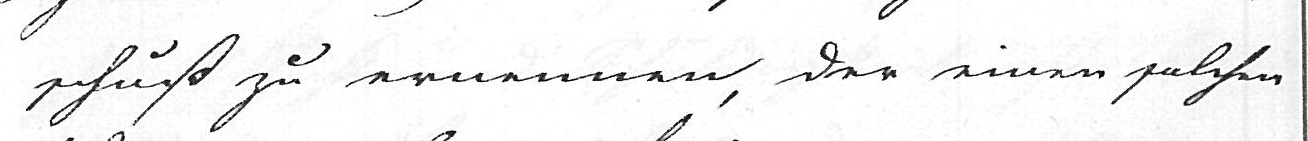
schuß zu ernennen, der einen solchen
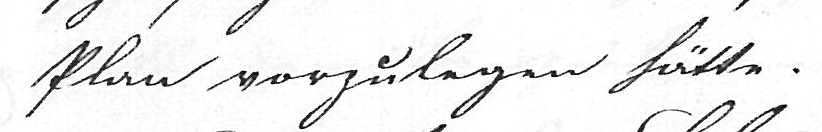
Plan vorzulegen hätte.
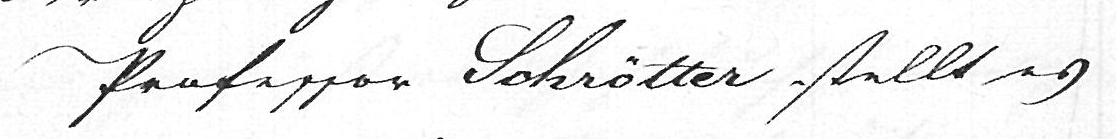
Professor Schrötter stellt es
